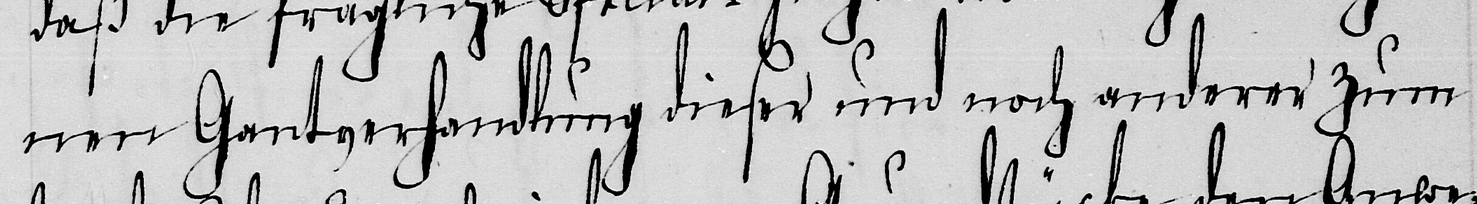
inen Gantverhandlung dieser und noch anderer zum
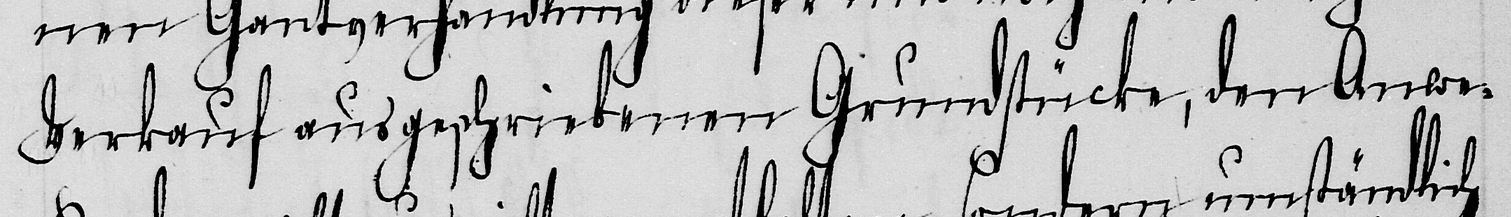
Verkauf ausgeschriebenen Grundstücke, den Anwe¬
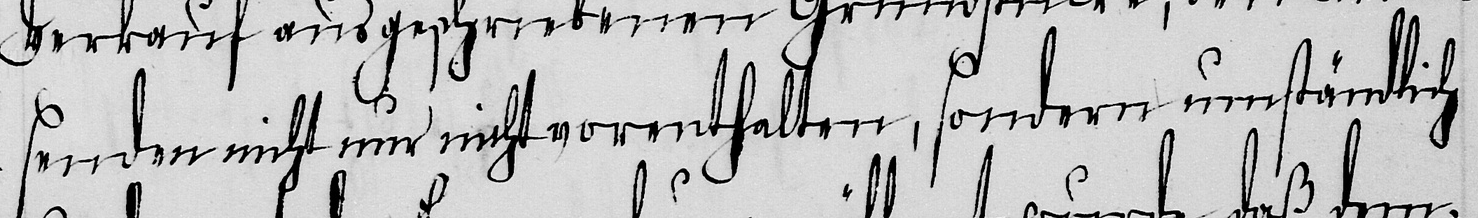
senden nicht nur nicht vorenthalten, sondern umständlich
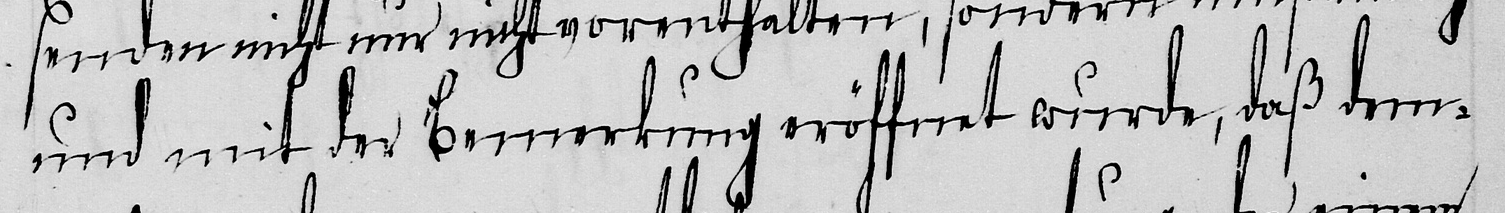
und mit der Bemerkung eröffnet wurde, daß dem¬
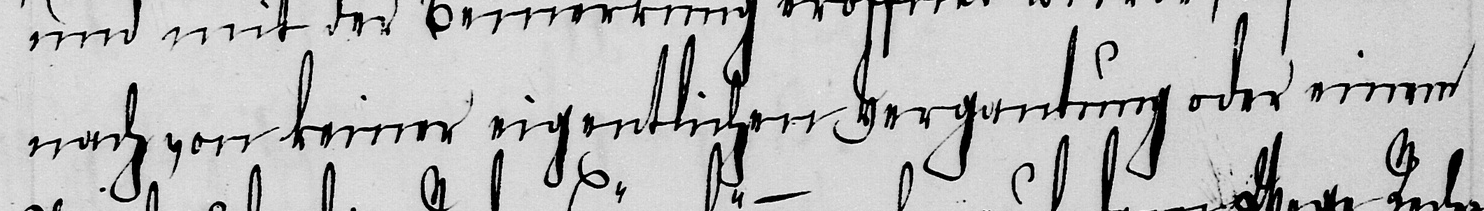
nach von keiner eigentlichen Vergantung oder einem
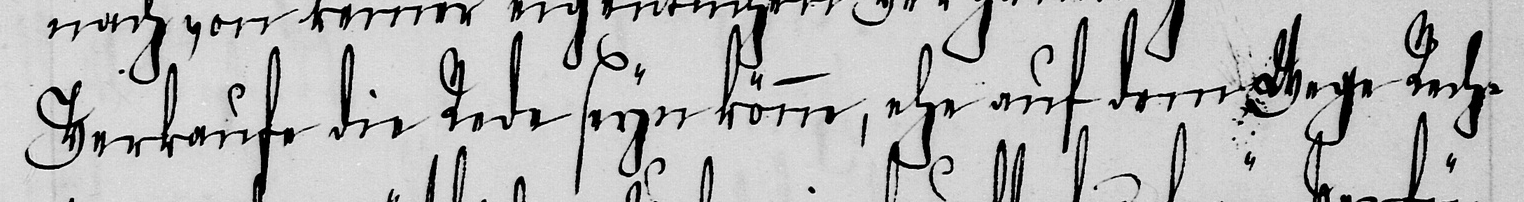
Verkaufe die Rede seyn könne, ehe auf dem Wege Rech¬
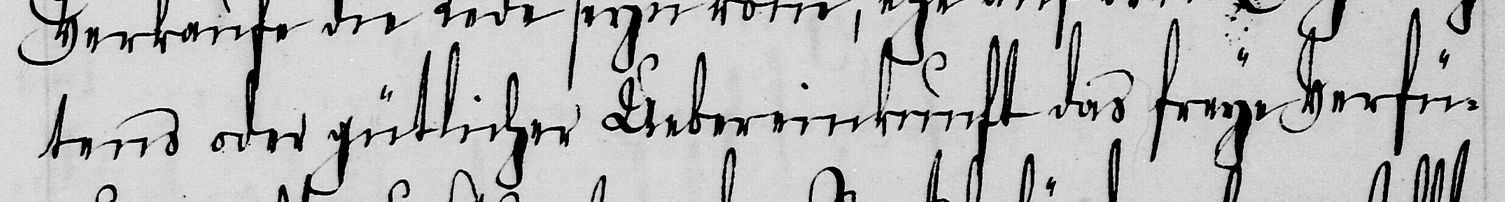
tens oder gütlicher Uebereinkunft das freye Verfü¬
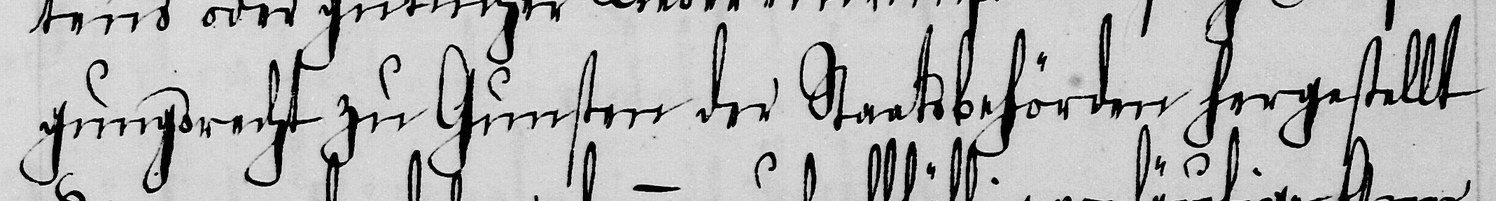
gungsrecht zu Gunsten der Staatsbehörden hergestellt
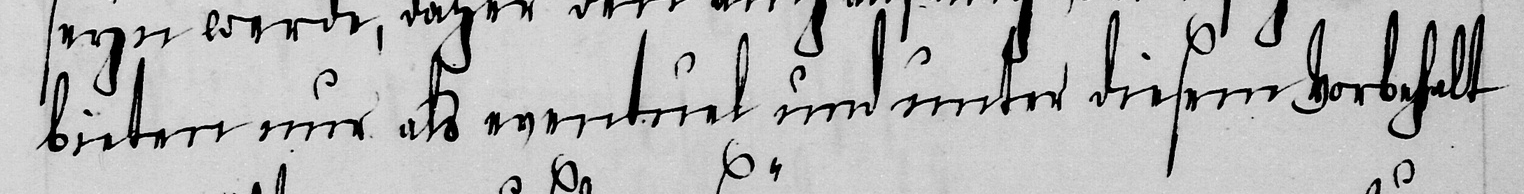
bieten nur als eventuel und unter diesem Vorbehalt
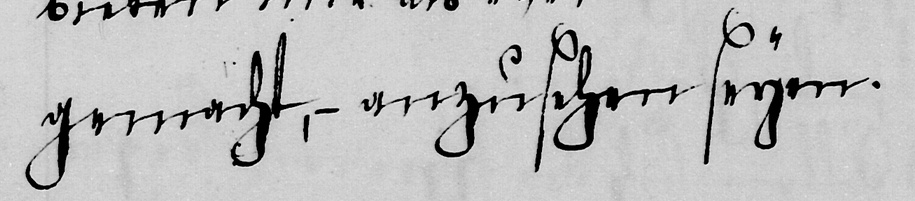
gemacht, – anzusehen seyen.
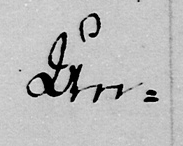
Aner¬
